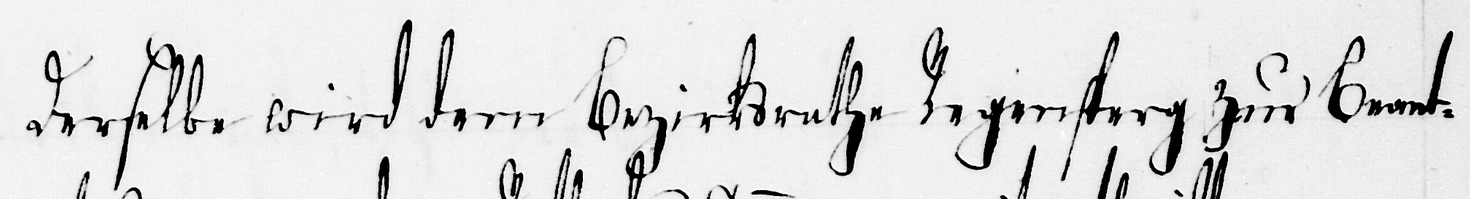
Derselbe wird dem Bezirksrathe Regensperg zur Beant¬
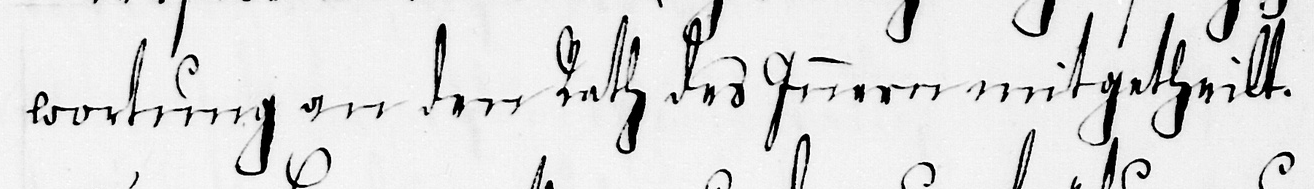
wortung an den Rath des Innern mitgetheilt.
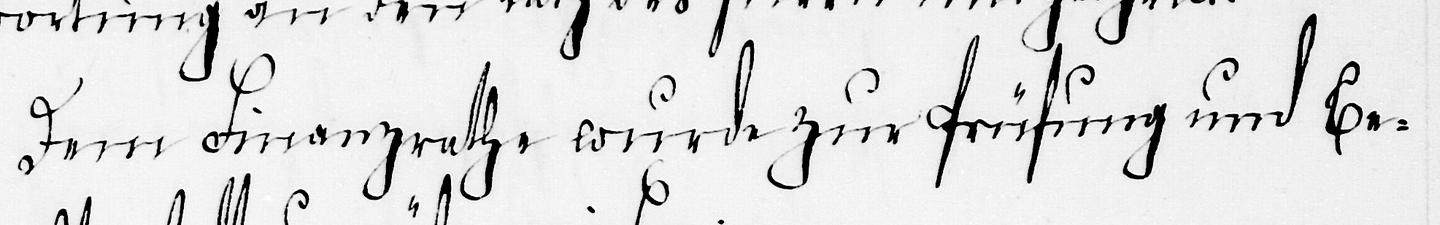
Dem Finanzrathe wurde zur Prüfung und Be¬
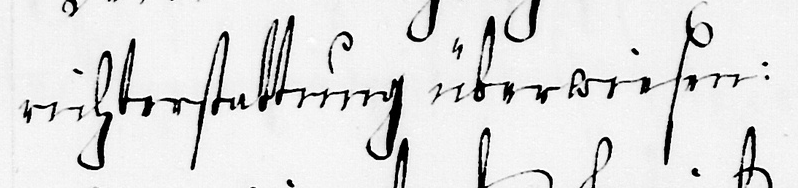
richterstattung überwiesen:
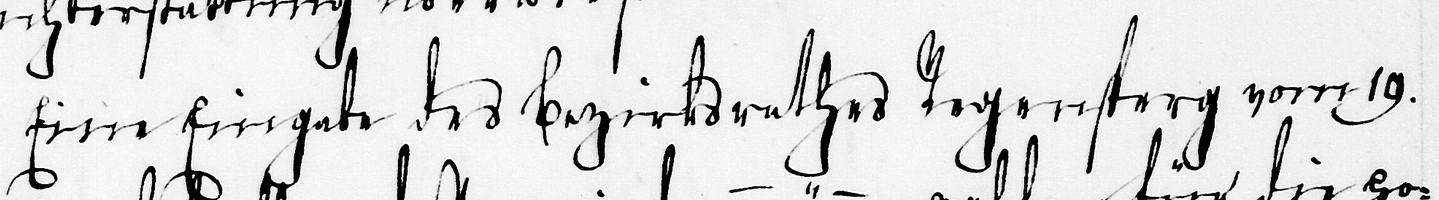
Eine Eingabe des Bezirksrathes Regensperg vom 19.
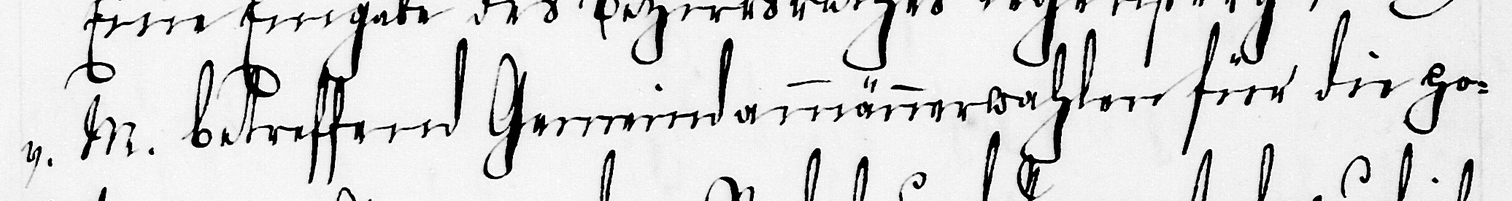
v. M. betreffend Gemeindammännerwahlen für die po¬
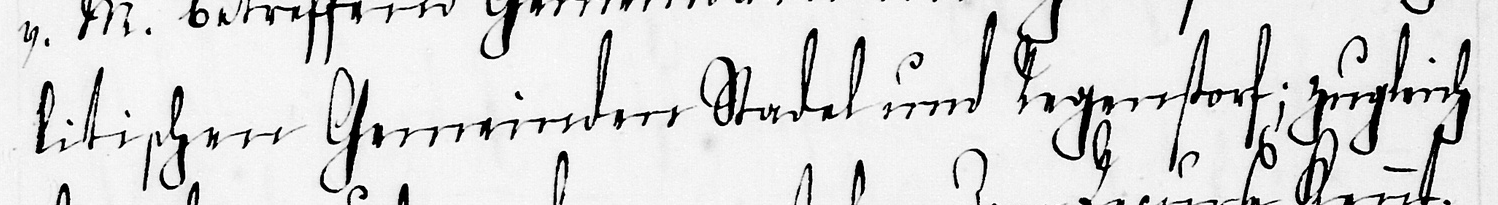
litischen Gemeinden Stadel und Regenstorf; zugleich
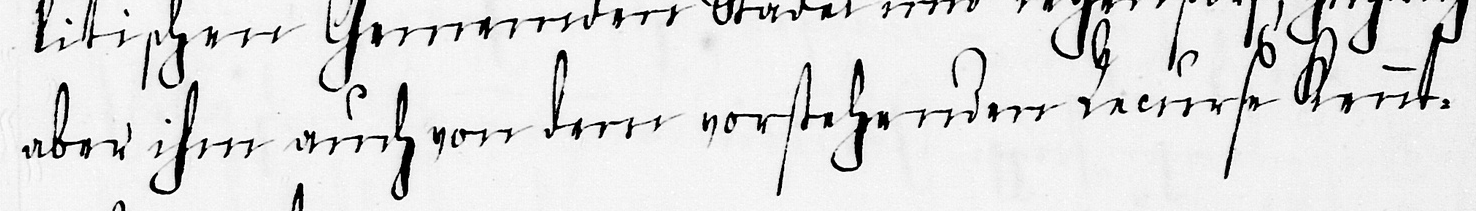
aber ihm auch von dem vorstehenden Recurse Kennt¬
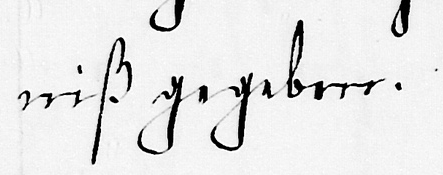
niß gegeben.
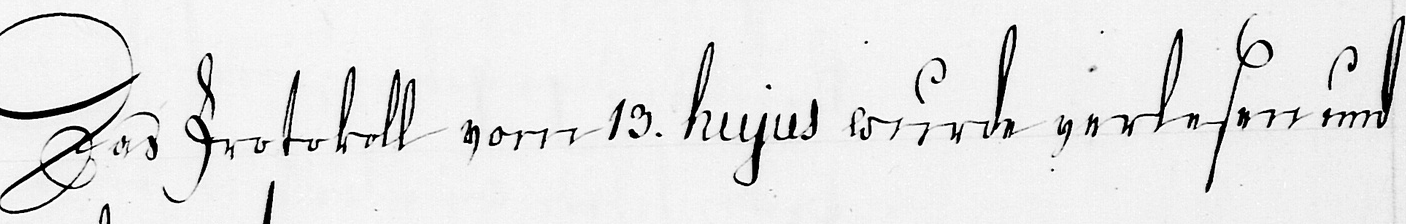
Das Protokoll vom 13. hujus wurde verlesen und
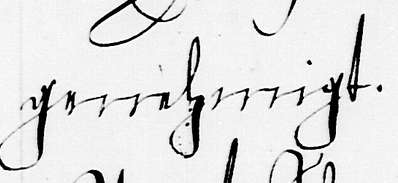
genehmigt.
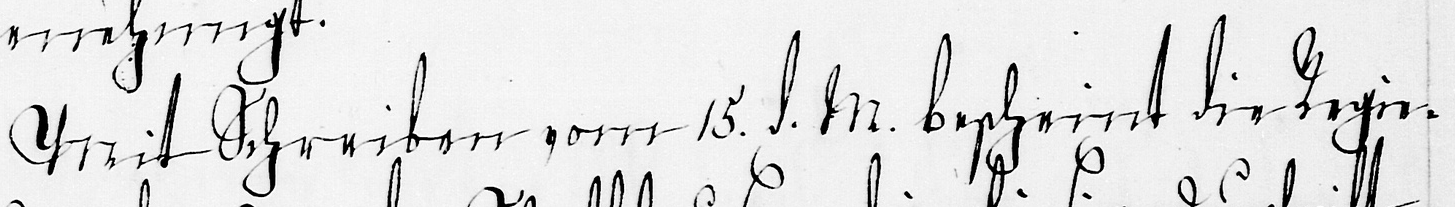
Mit Schreiben vom 15. d. M. bescheint die Regie¬
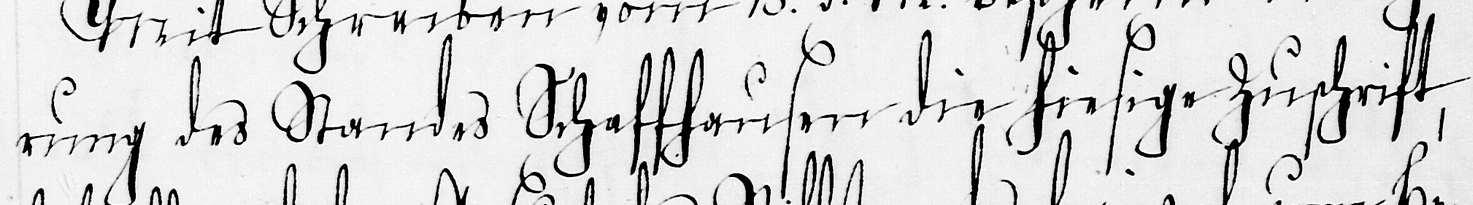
rung des Standes Schaffhausen die hiesige Zuschrift,
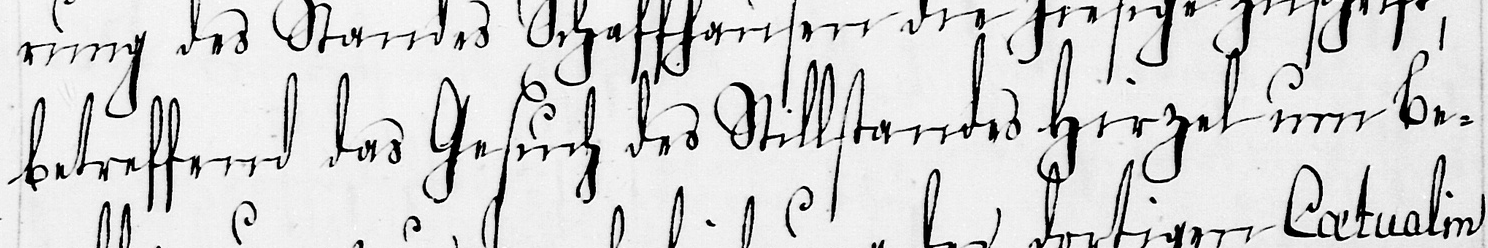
betreffend das Gesuch des Stillstandes Hirzel um Be¬
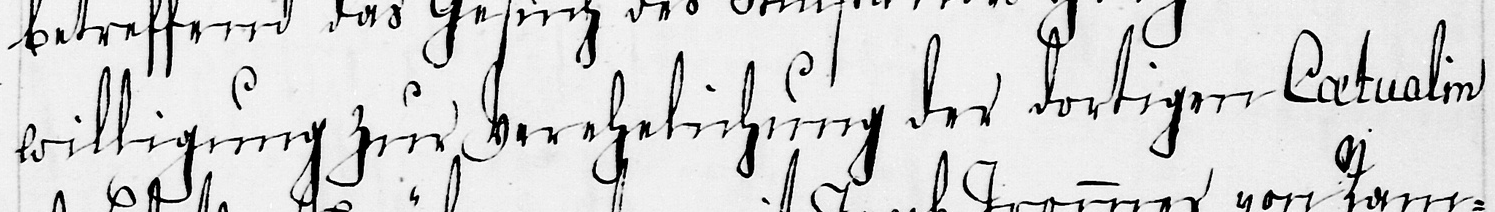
willigung zur Verehelichung der dortigen Catualin
